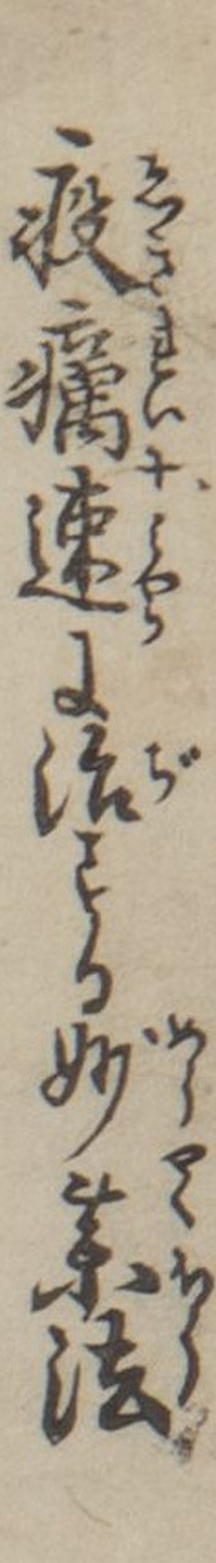疫癘速に治する妙薬法
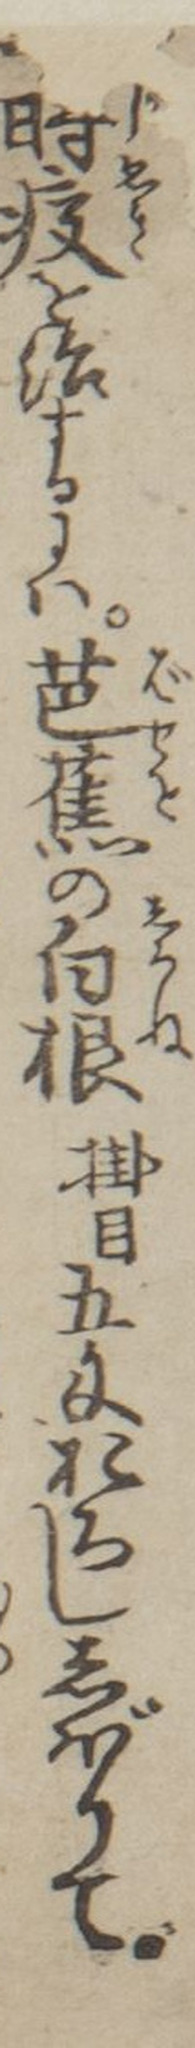時疫を治するには。芭蕉の白根掛目五匁おろししぼりて。
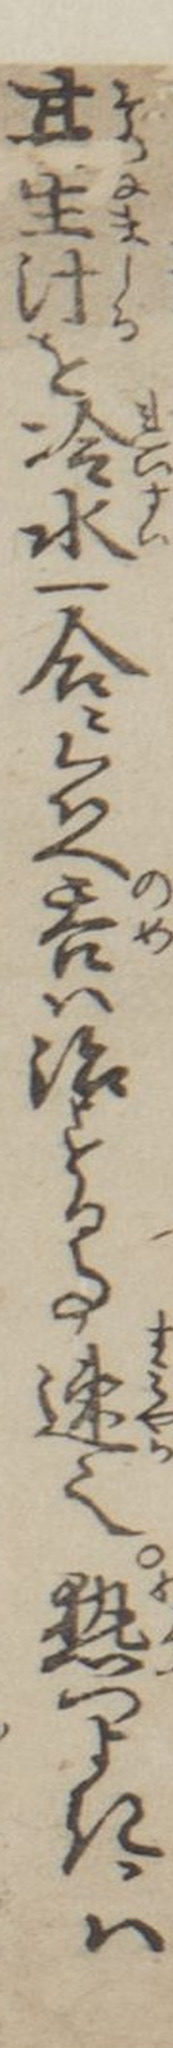其生汁を冷水一合にくはへ呑は治する事速也。熱つよきには
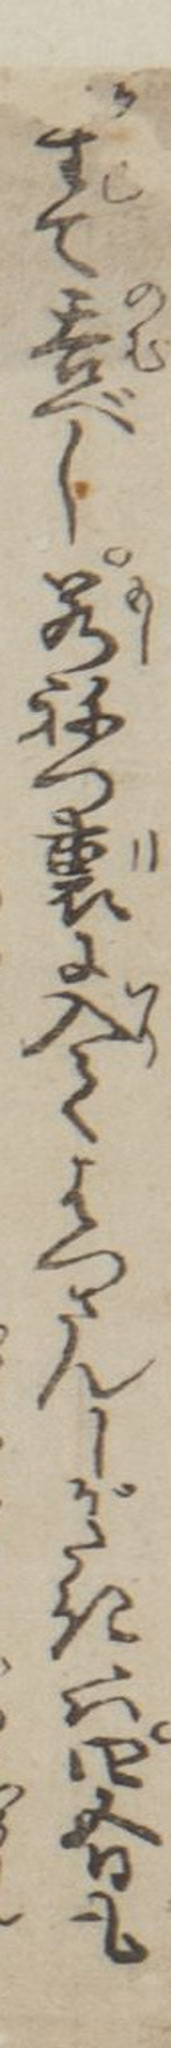て呑べし。若ねつ裏に入てはつさんしがたきには。四五日も
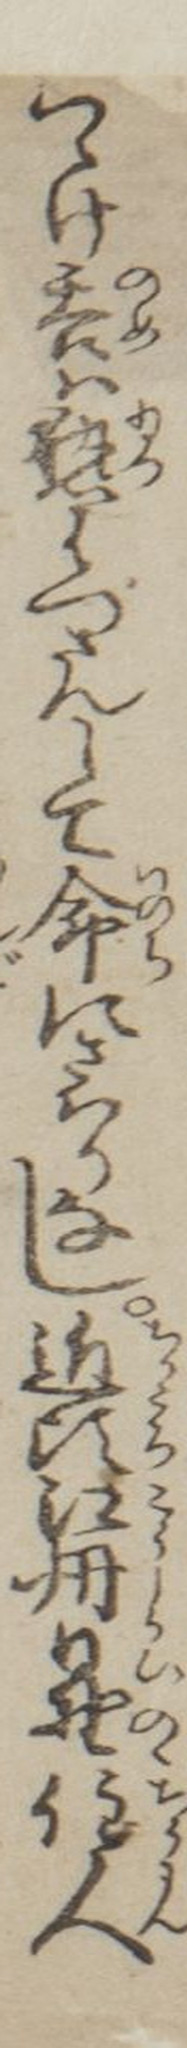つゝけ呑は熱はつさんして命にさはりなし。近頃江州日野住人
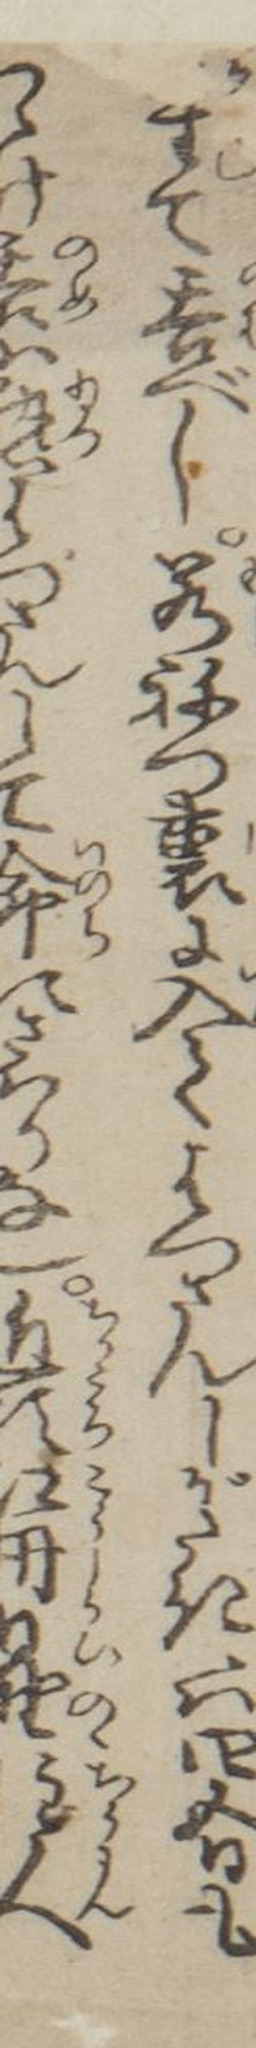つゝけ呑は熱はつさんして命にさはりなし。近頃江州日野住人
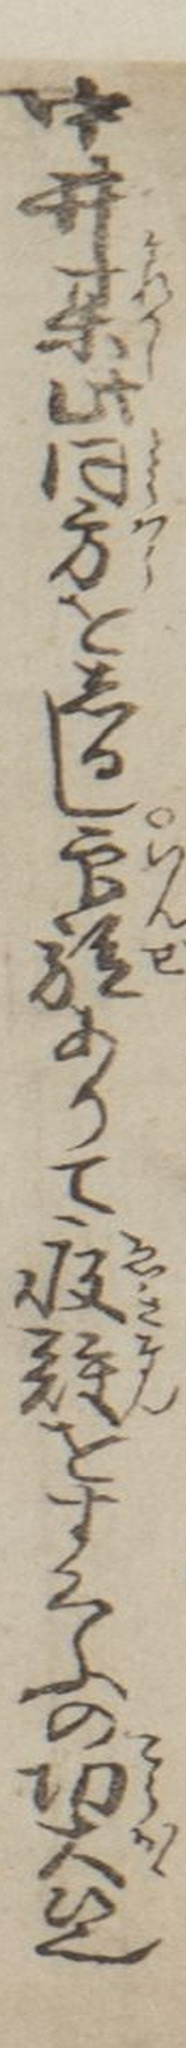中井某此同方をしるし。印施ありて疫難をすくふの功大ひ也
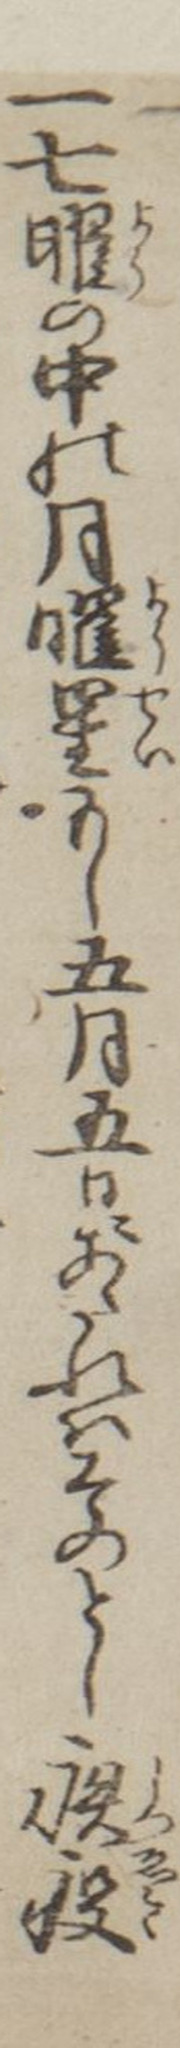一七曜の中の月曜星もし五月五日にあたれはそのとし疾疫
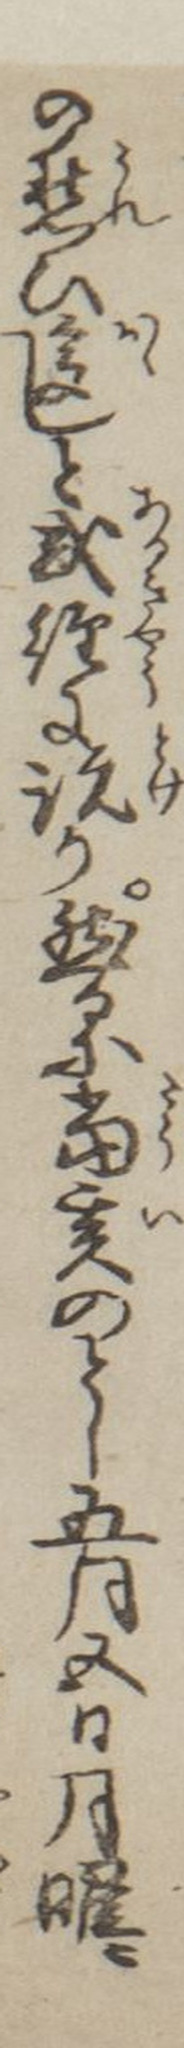の愁ひ多しと或経に説り。然るに当亥のとし五月五日月曜に
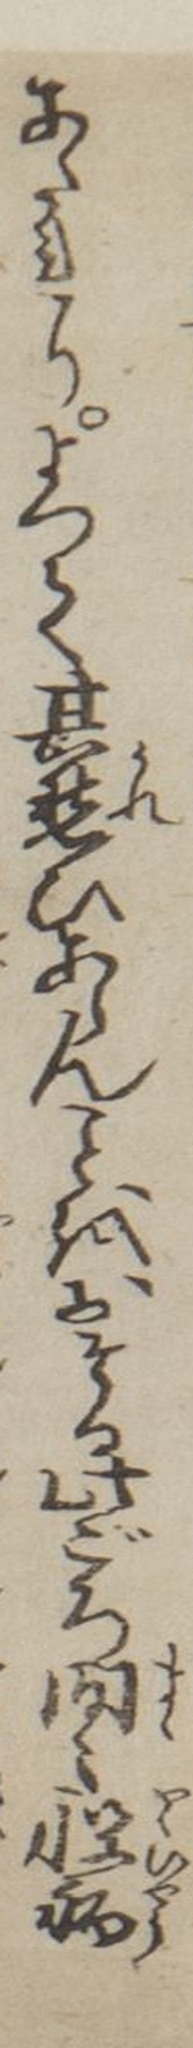あたれり。よつて其愁ひあらんことをおそる此ごろ間々疫病
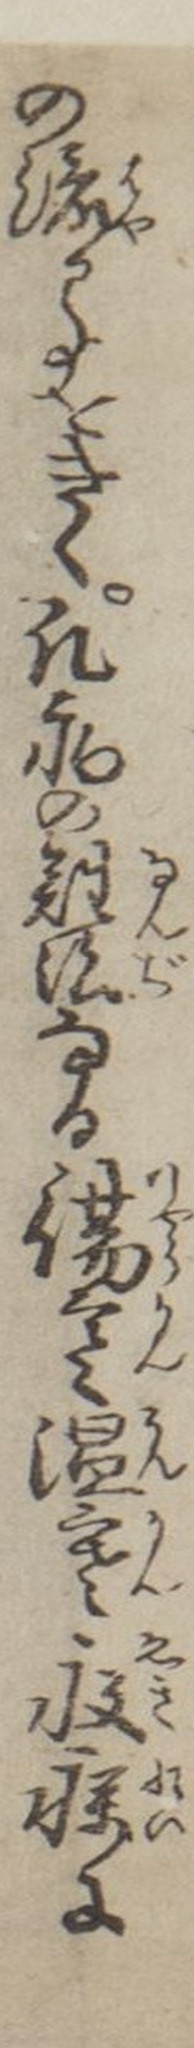の流る事をきく。凡病の難治なる傷寒温寒疫癘に
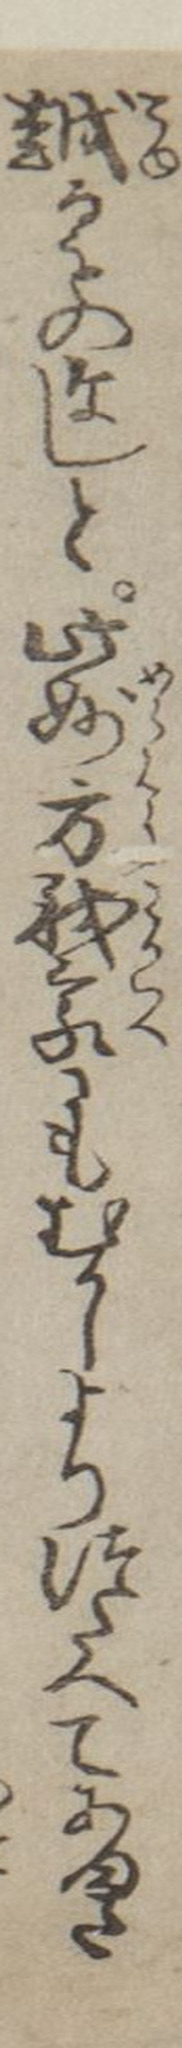越るものなしと。此妙方我家にもむかしよりつたへてあまた
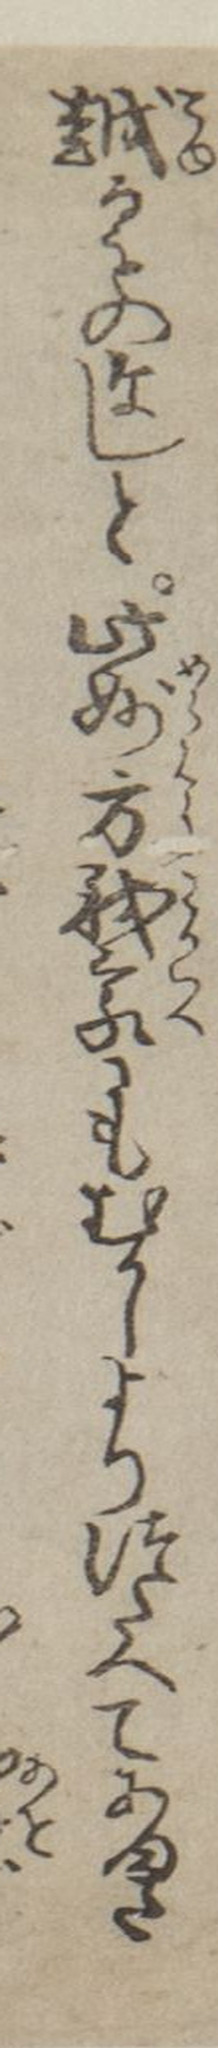越るものなしと。此妙方我家にもむかしよりつたへてあまた
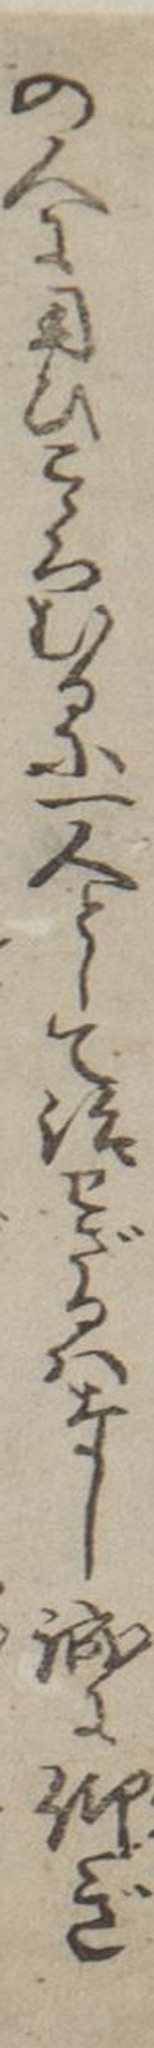の人に用ひこゝろむるに一人として治せざるはなし誠に仰ぎ
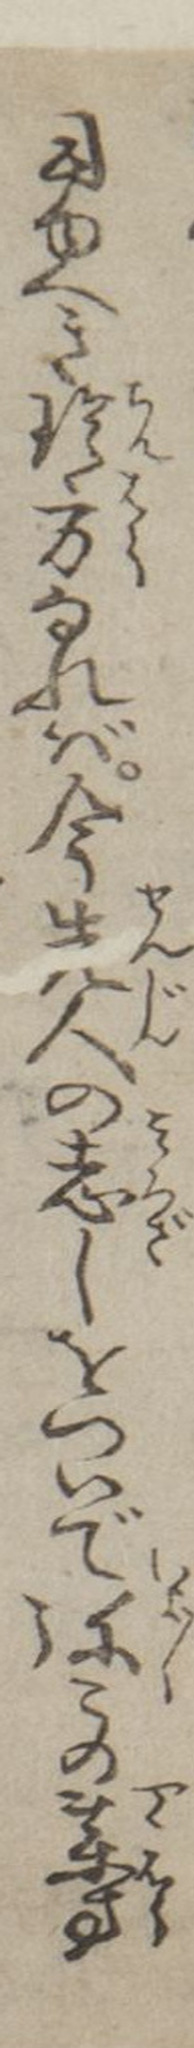用ゆへき珍方なれば。今先人の志しをついで弥この薬方
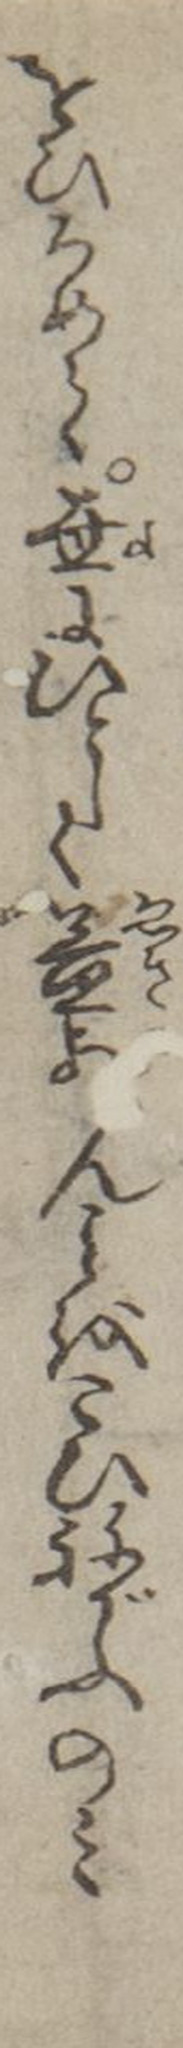をひろめて。世にひとしく益あんことをこひねがふのみ
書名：疫癘速かに治する妙薬法
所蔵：あいおいニッセイ同和損保株式会社
